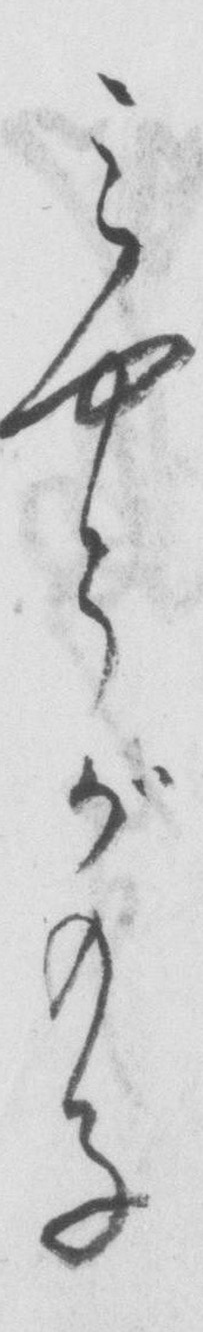たミやうがの子
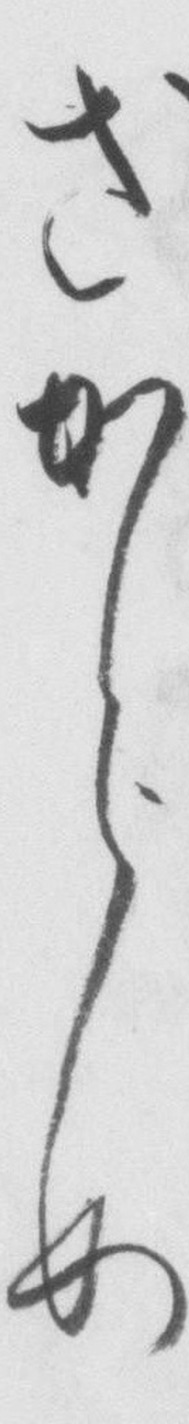さがらめ
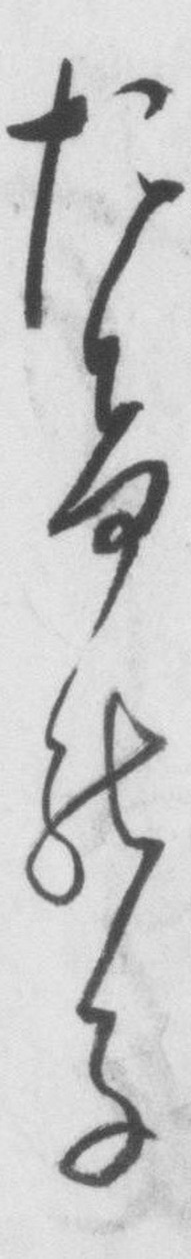たけの子

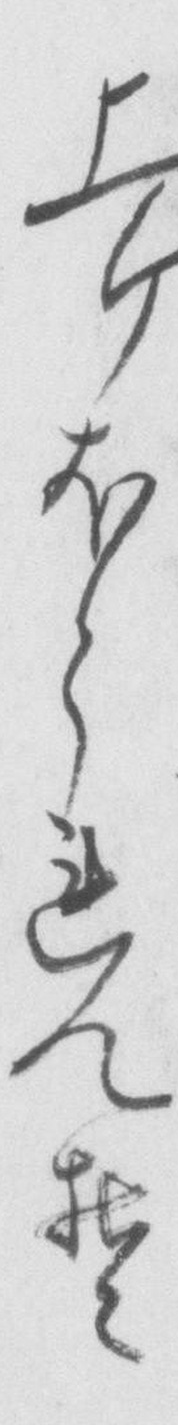上ヶほうれん草
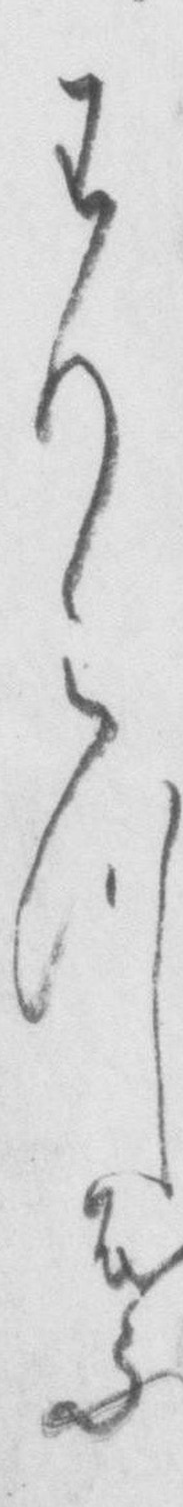わりミつろ

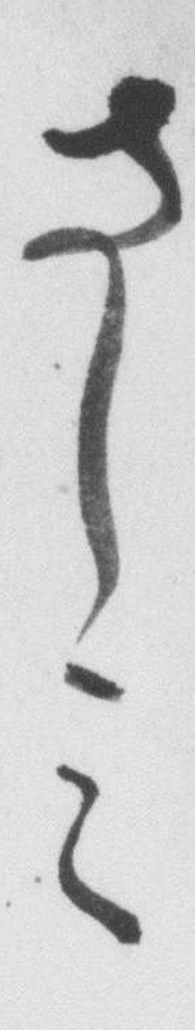さしミ
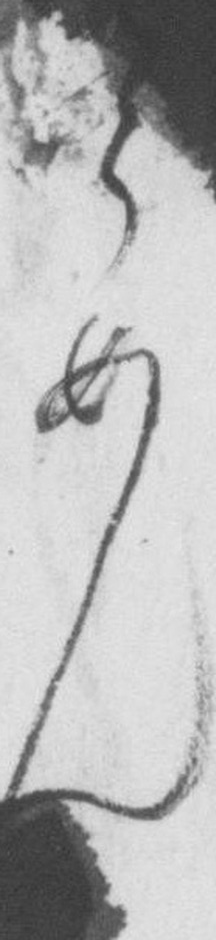らめん
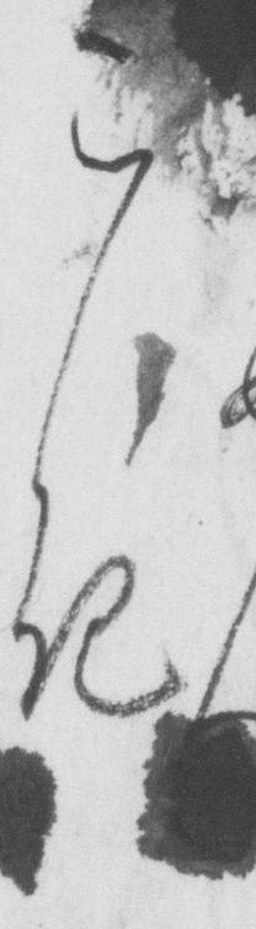こしき

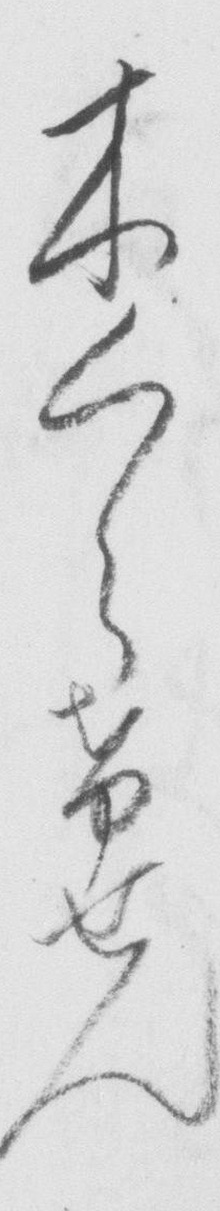こ木くらけせん

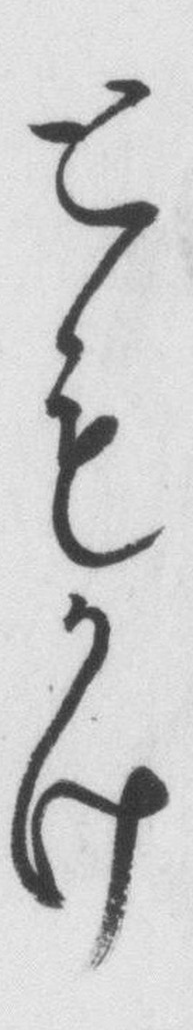ともかけ

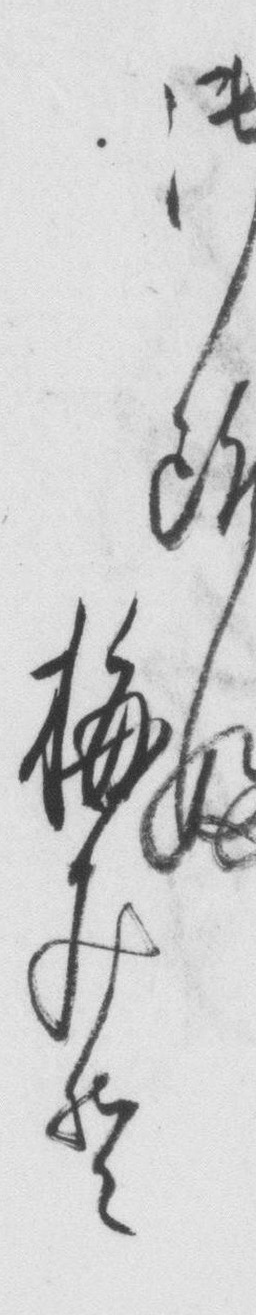梅みそ
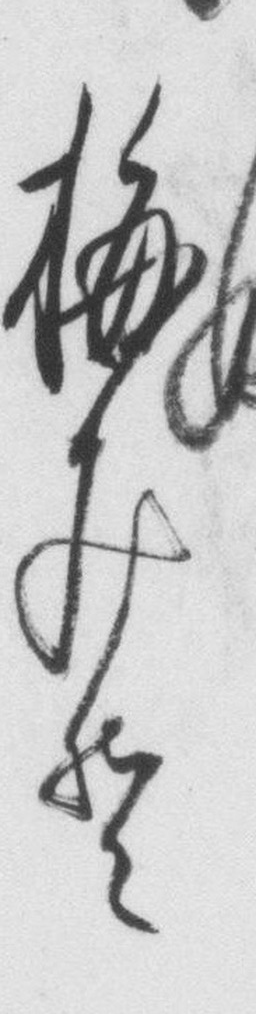梅みそ
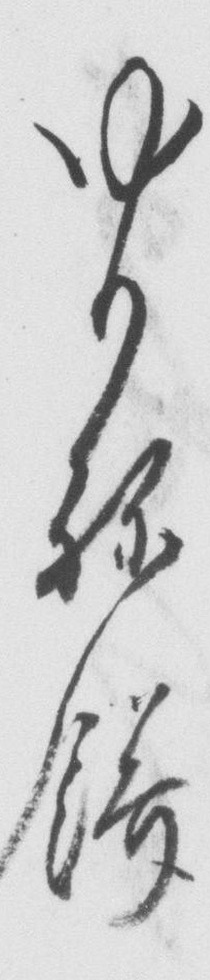ゆりね餅
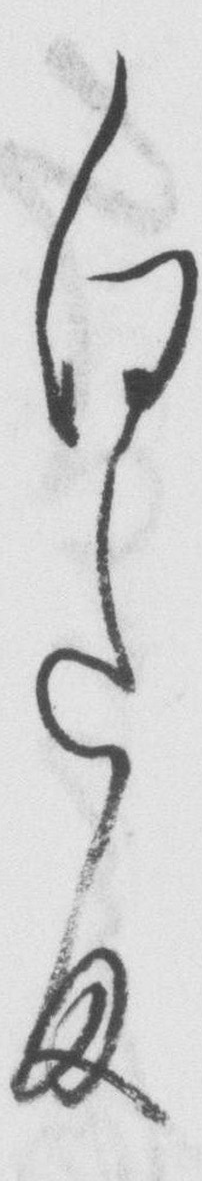白たま
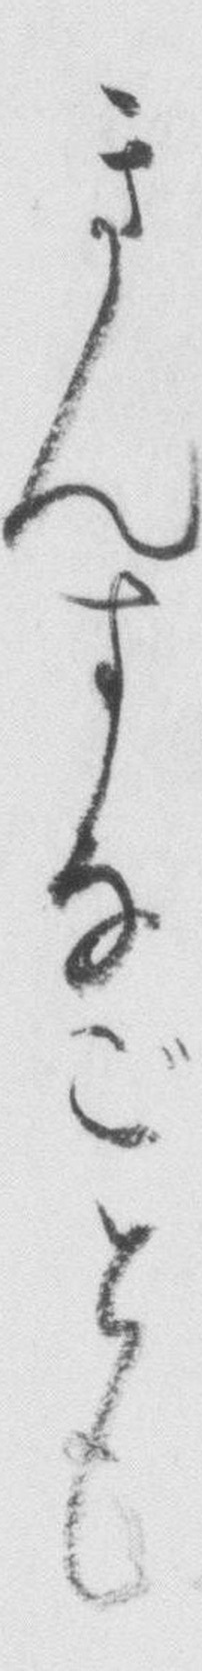きんすることも
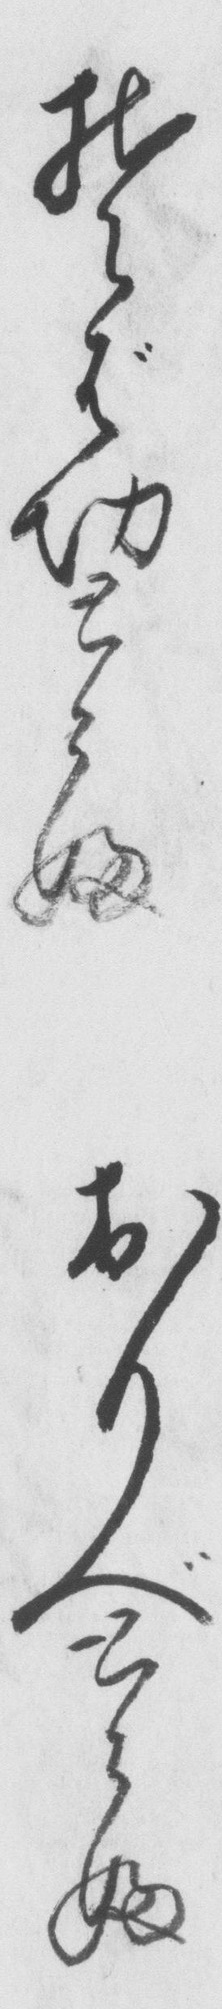そば切とうふおりべとうふ
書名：料理筌
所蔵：大阪府立大学学術情報センター 国文学研究資料館
